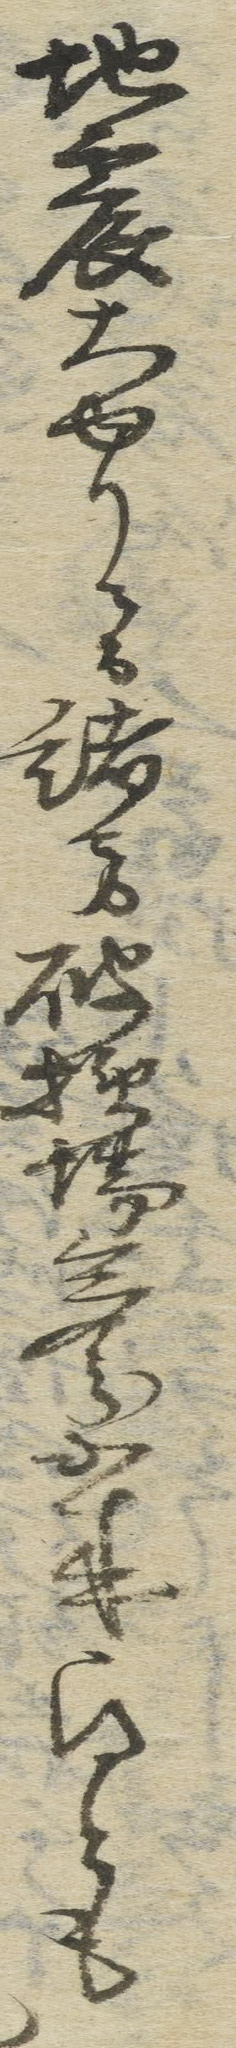地震大ゆり二而諸方破損場多分に成候得とも
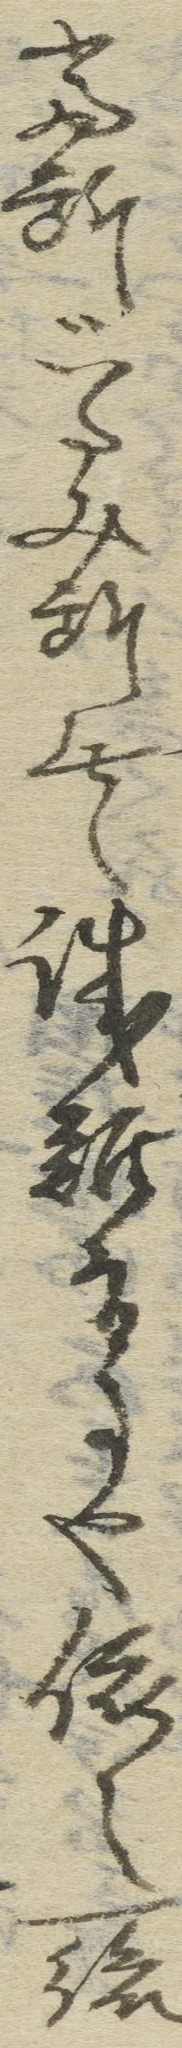当所ハいたみ所無之儀難有事也依之一統
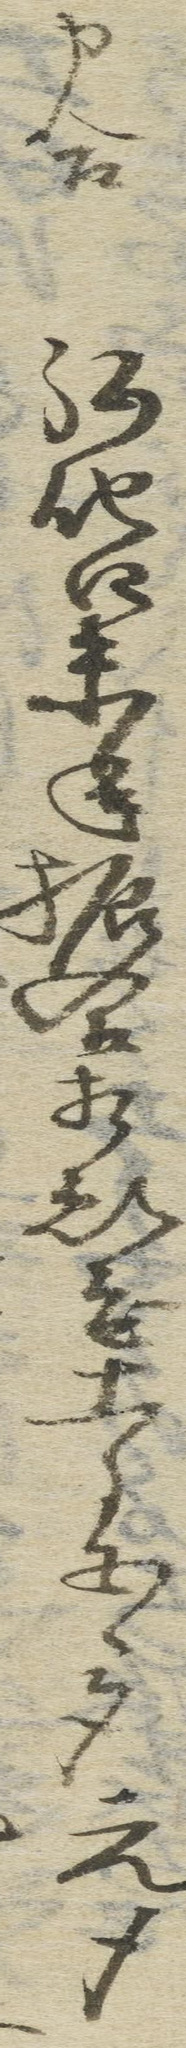申合弘化四未年振合相願を十一月五日夕元〆
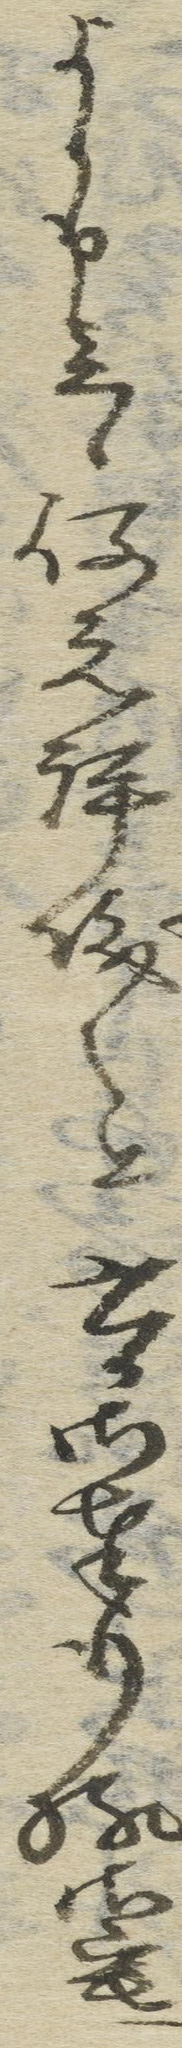より申上候役元評儀之上六日御奉行様御宅へ
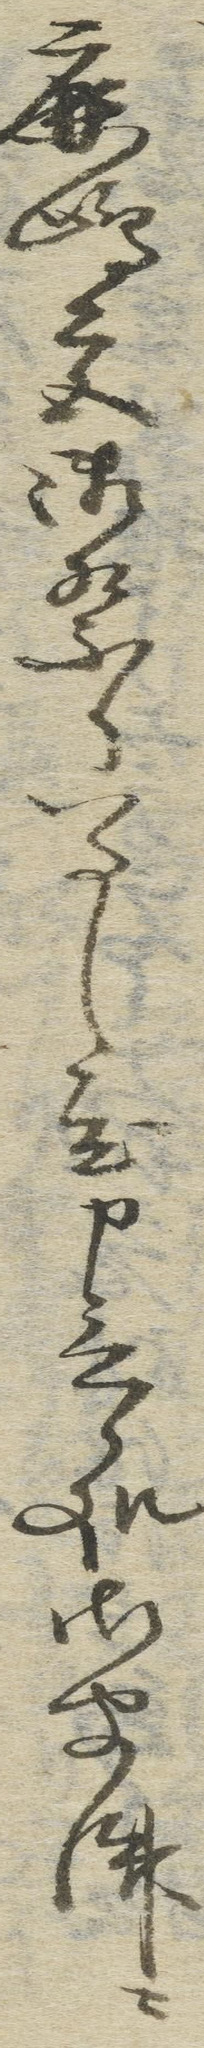鹿島宮御祭りいたし度申立候処御聞済二
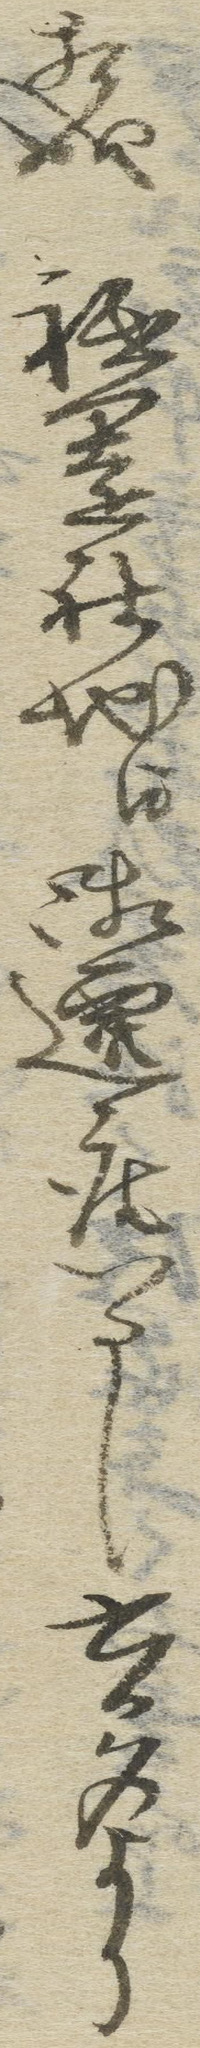相成稲里宮社地江御遷座いたし六日夕より
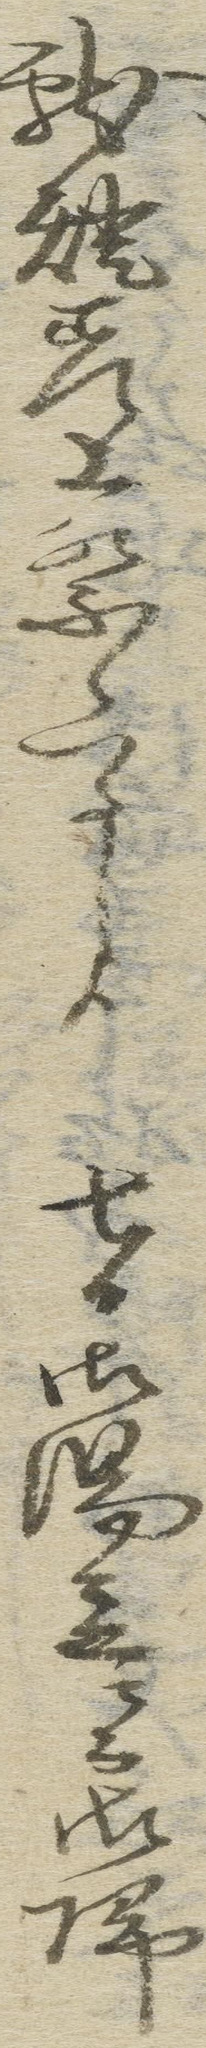献灯差上祭いたし候七日御湯立二而御帰
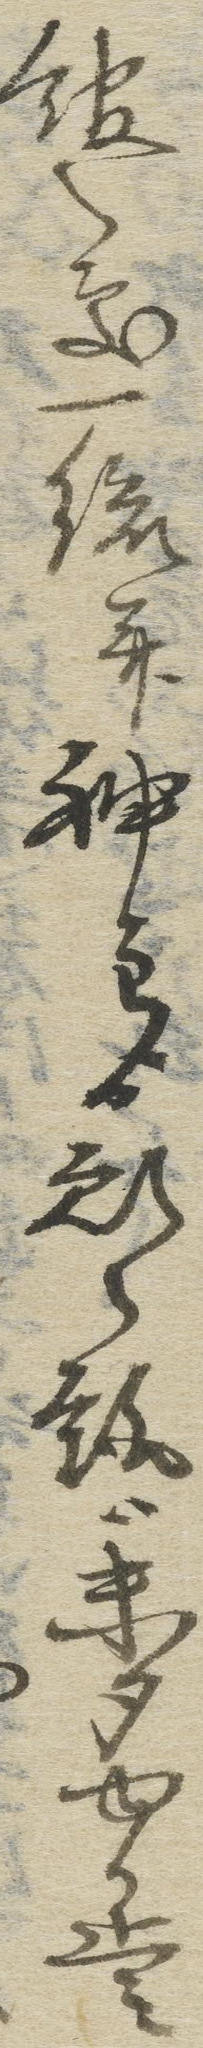館之処一統并神主ゟ願之趣ハ未タゆり止ミ
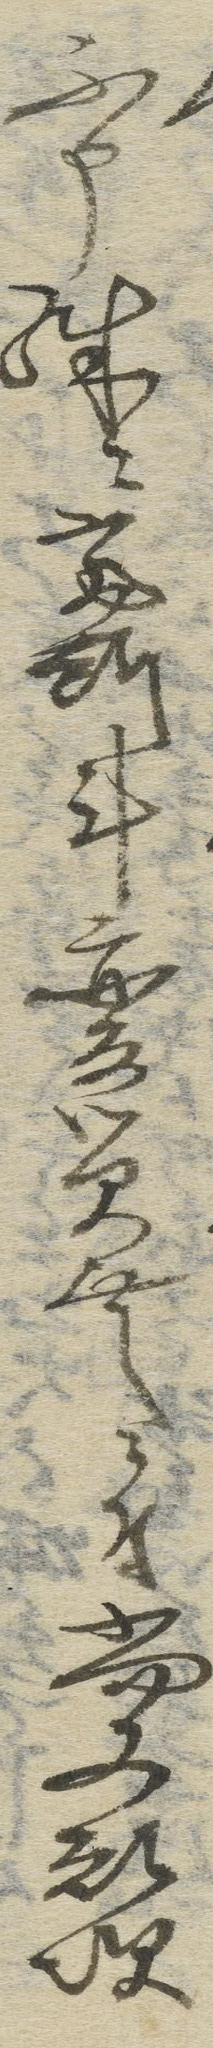不申殊二当所計変災無之候二付尚又願次
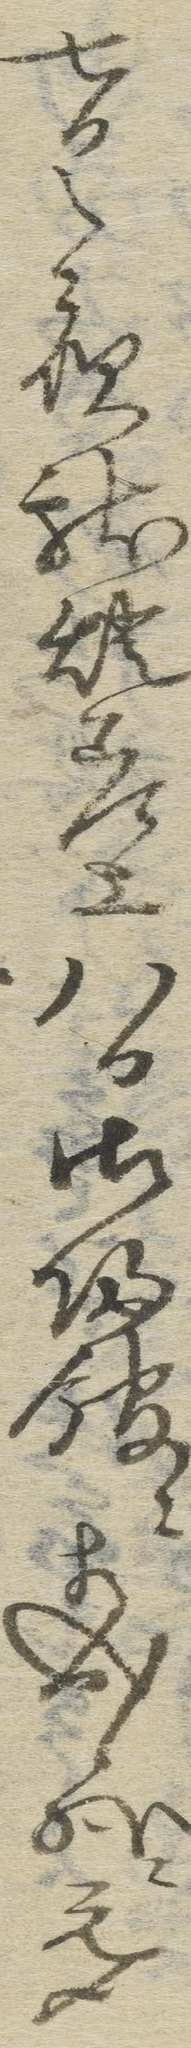七日之夜献燈差上八日御帰館二相成候様二元〆
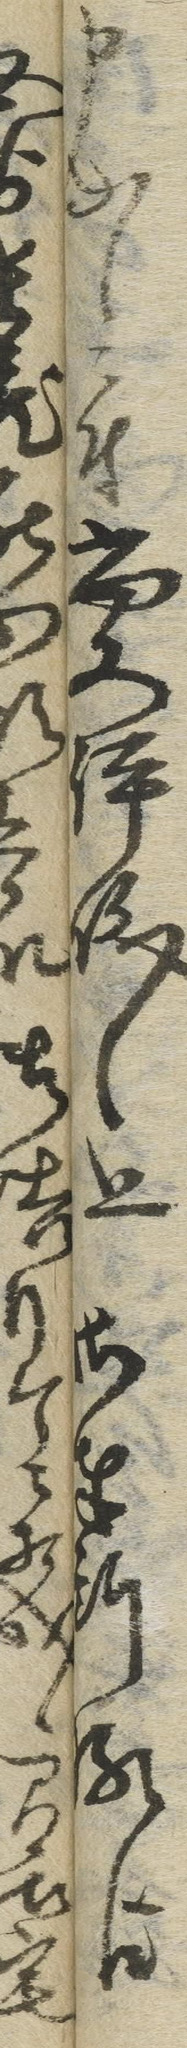申出候二付尚又評儀之上御奉行所様江
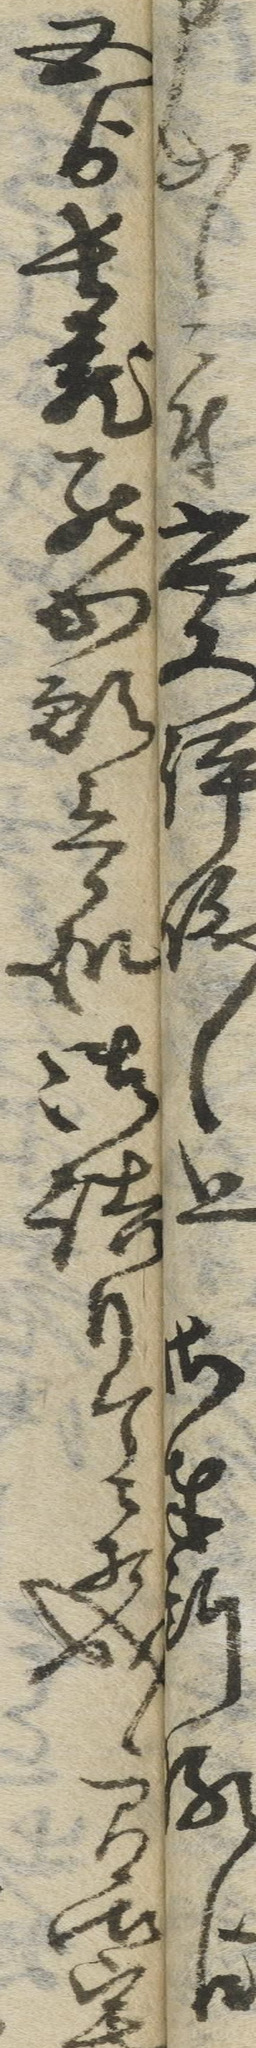五右衛門長蔵罷出願立候処御詰引上二相成候間御宅
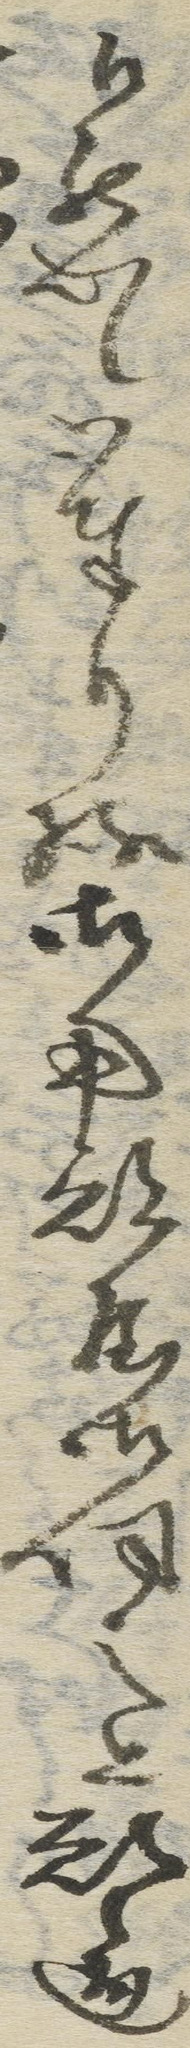江罷出候御奉行様御用願度御伺之上願之通
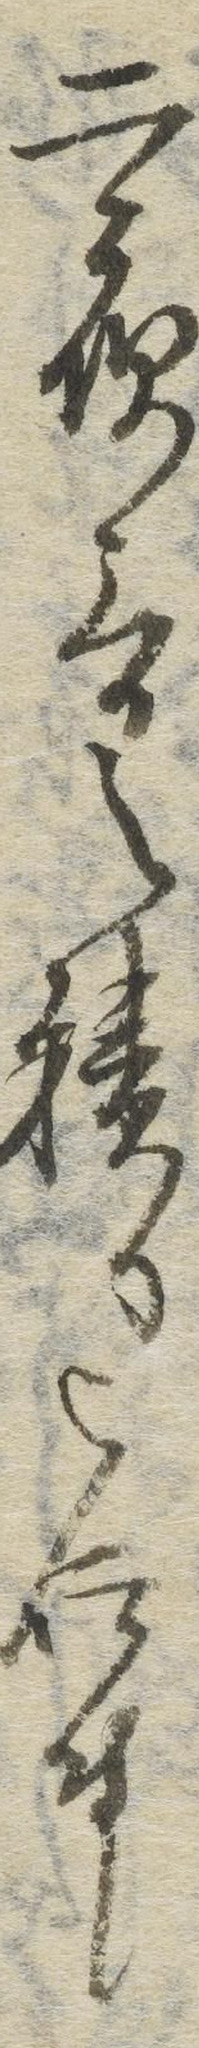二夜三日之積り被仰付
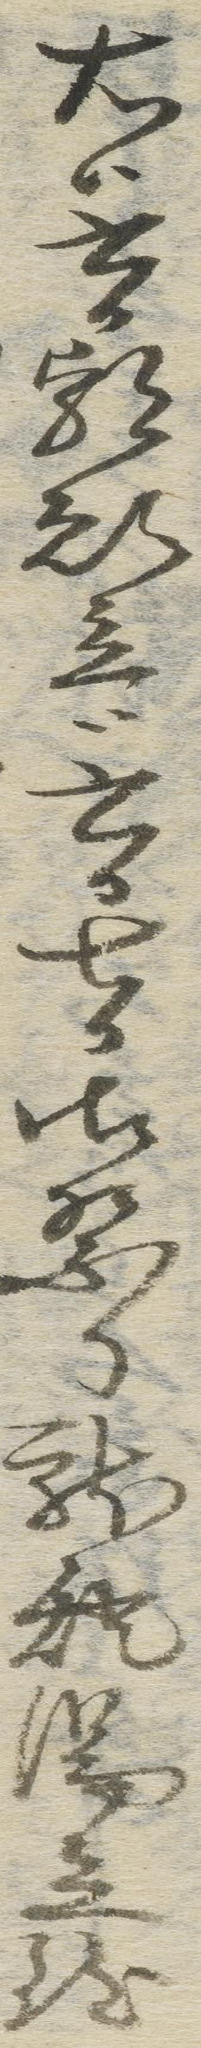右ハ六日朝願立ハ六日七日御祭り献燈湯立致
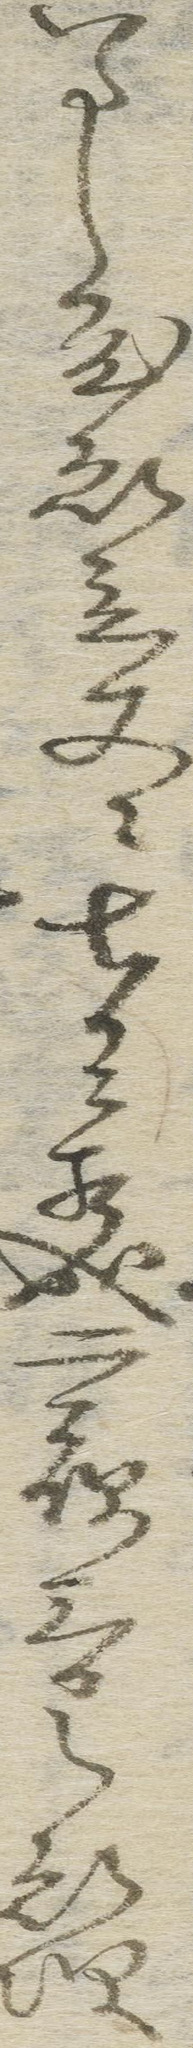いたし度願立又々七日二相成二夜三日之願次
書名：信濃越後　地震書留
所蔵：東京大学地震研究所図書室 Earthquake Research Institute Library, The University of Tokyo, JAPAN
